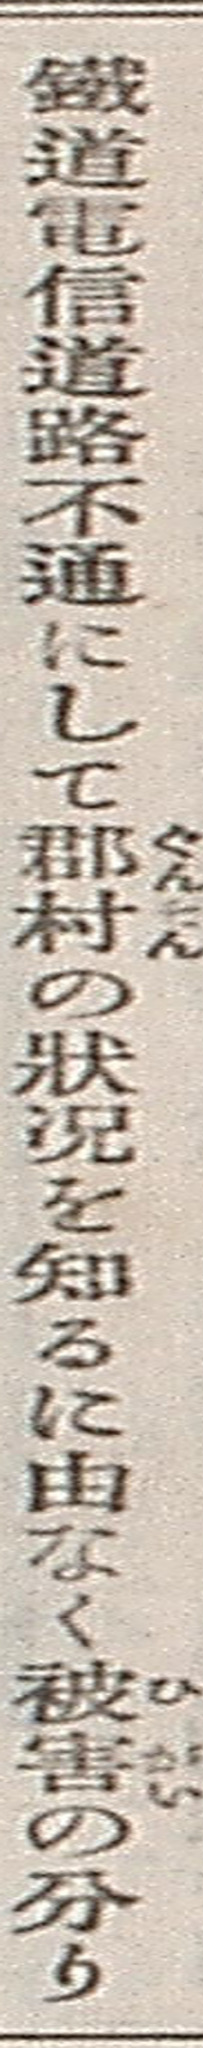鉄道電信道路不通にして郡村の状況を知るに由なく被害の分り
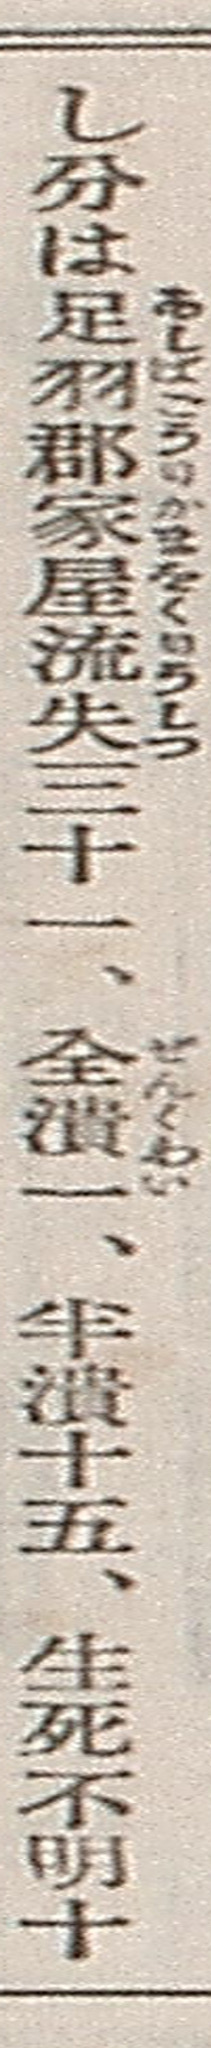し分は足羽郡家屋流失三十一、全潰一、半潰十五、生死不明十
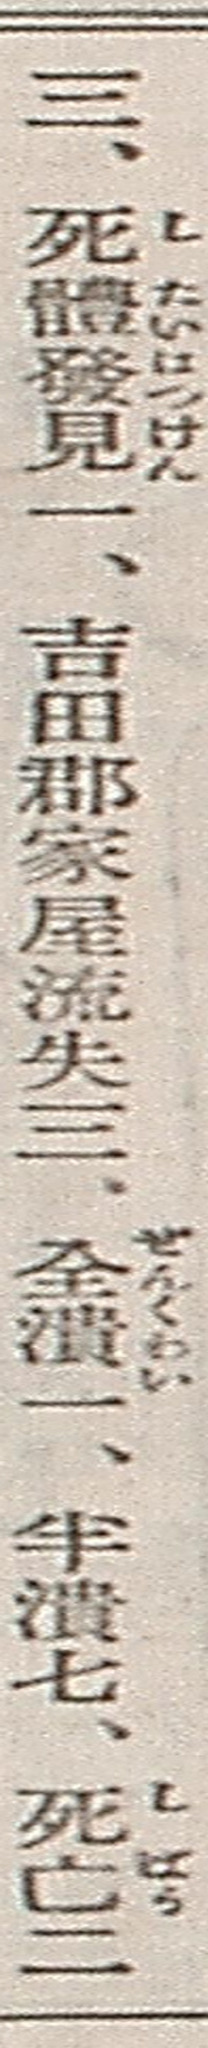三、死体発見一、吉田郡家屋流失三、全潰一、半潰七、死亡二
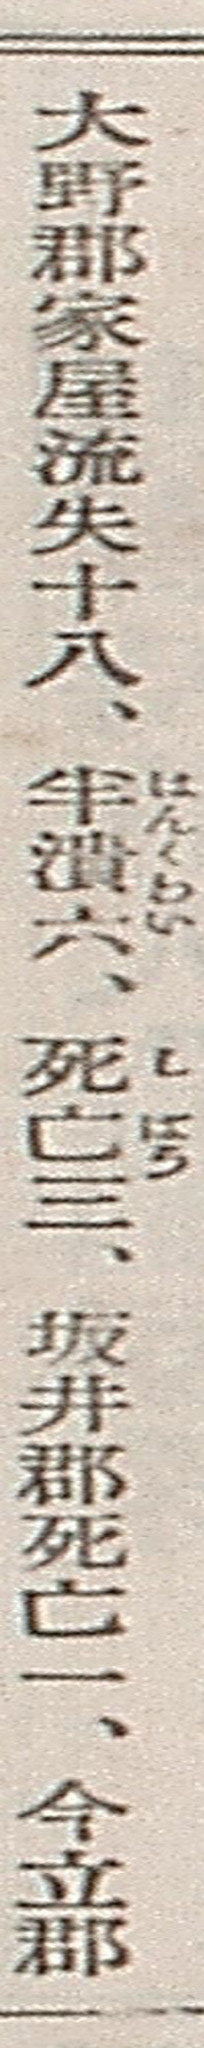大野郡家屋流失十八、半潰六、死亡三、坂井郡死亡一、今立郡

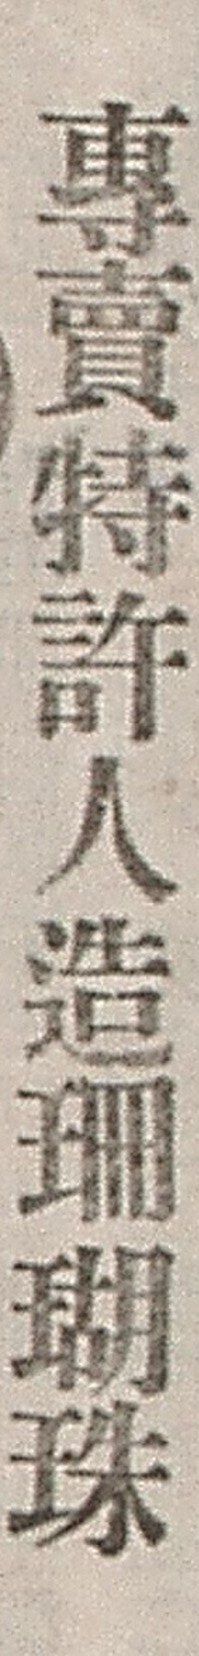専売特許人造珊瑚珠
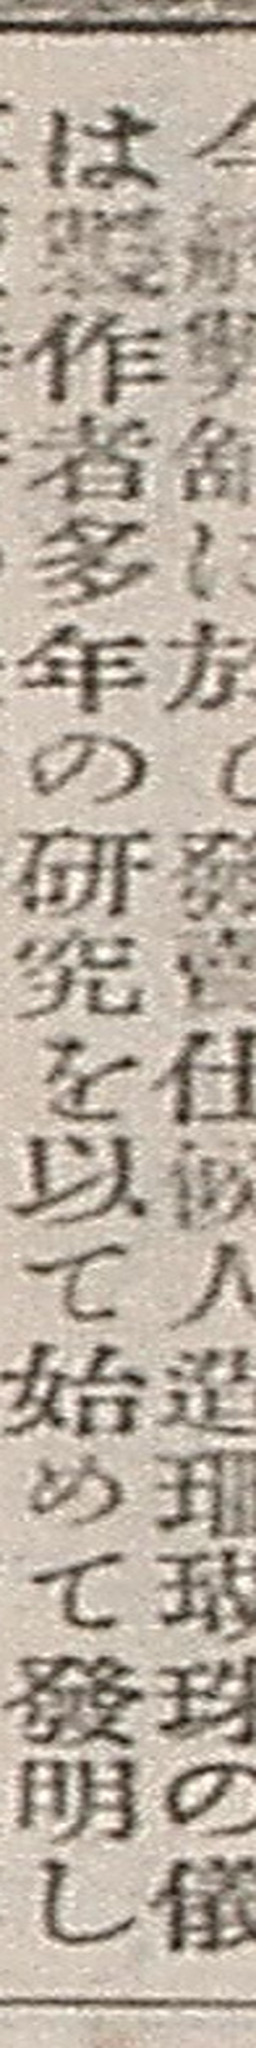は製作者多年の研究を以て始めて発明し
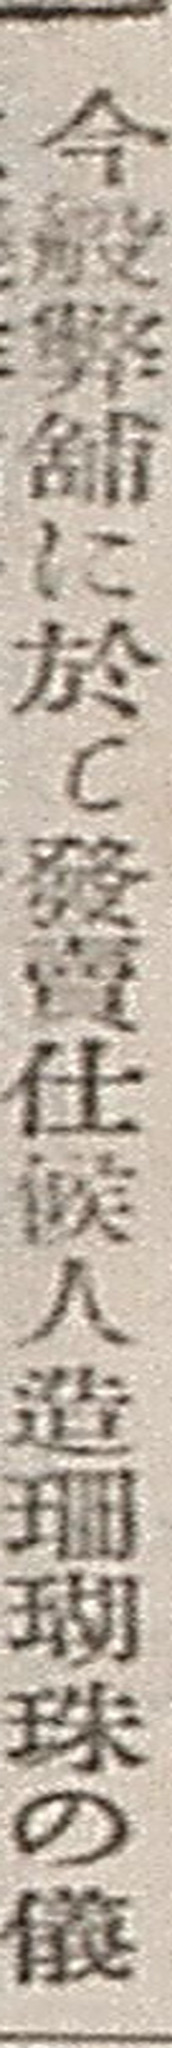今般弊舗に於て発売仕候人造珊瑚珠の儀
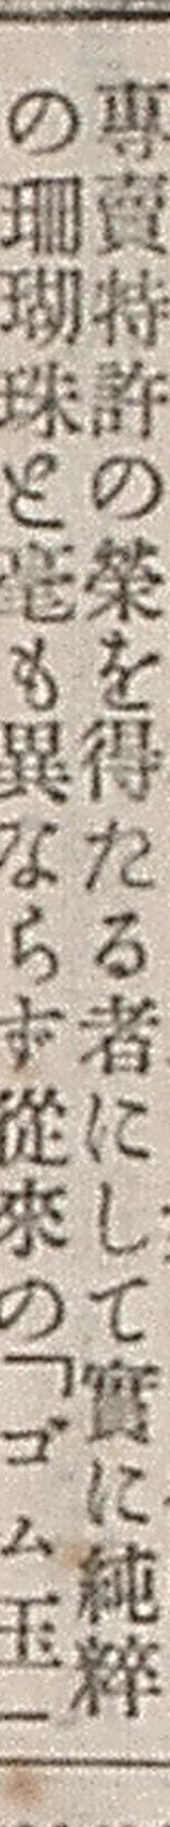専売特許の栄を得たる者にして実に純粋
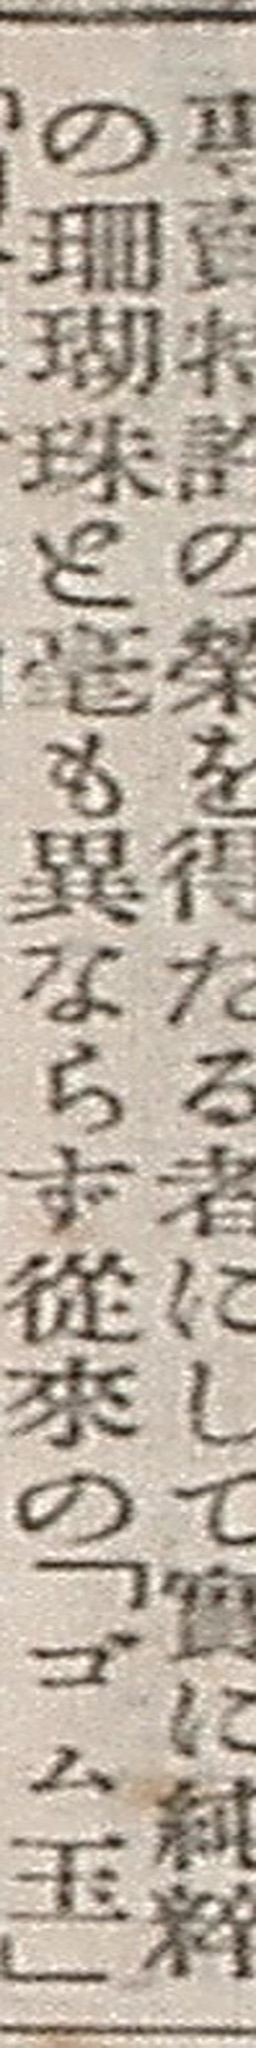の珊瑚珠そ毫も異ならず従来の「ゴム玉」
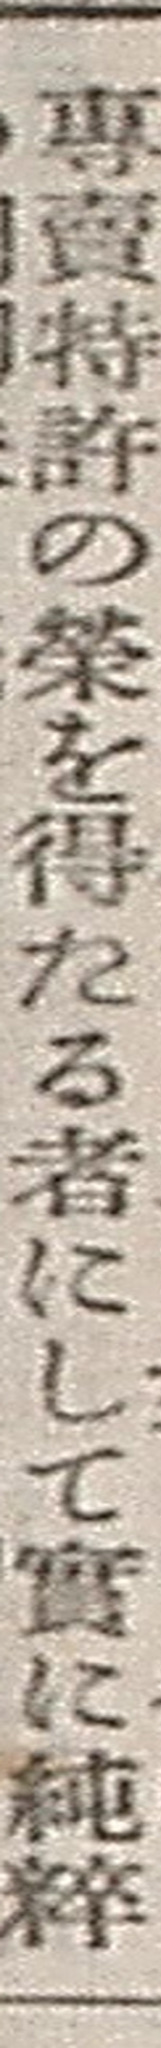専売特許の栄を得たる者にして実に純粋
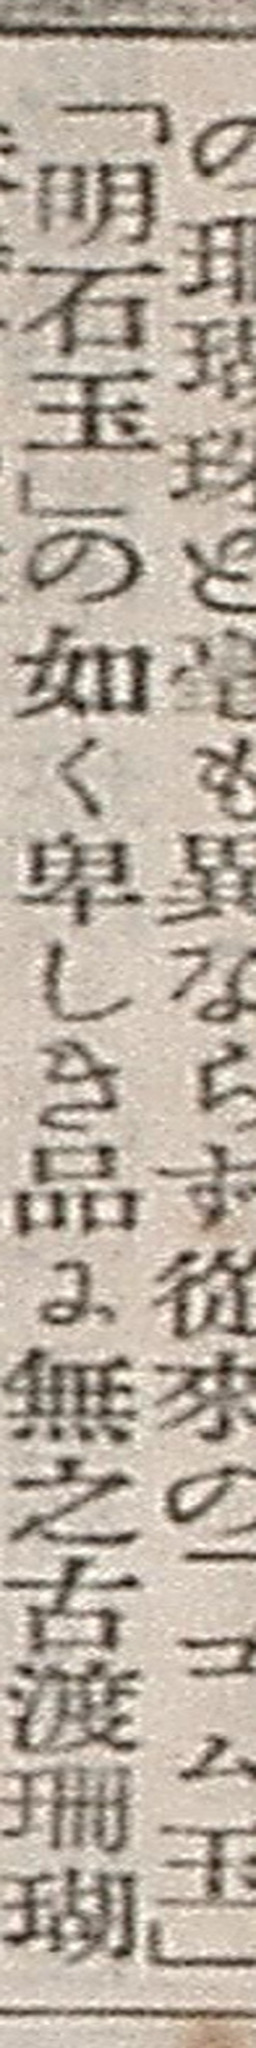「明石玉」の如く卑しき品に無之古渡珊瑚
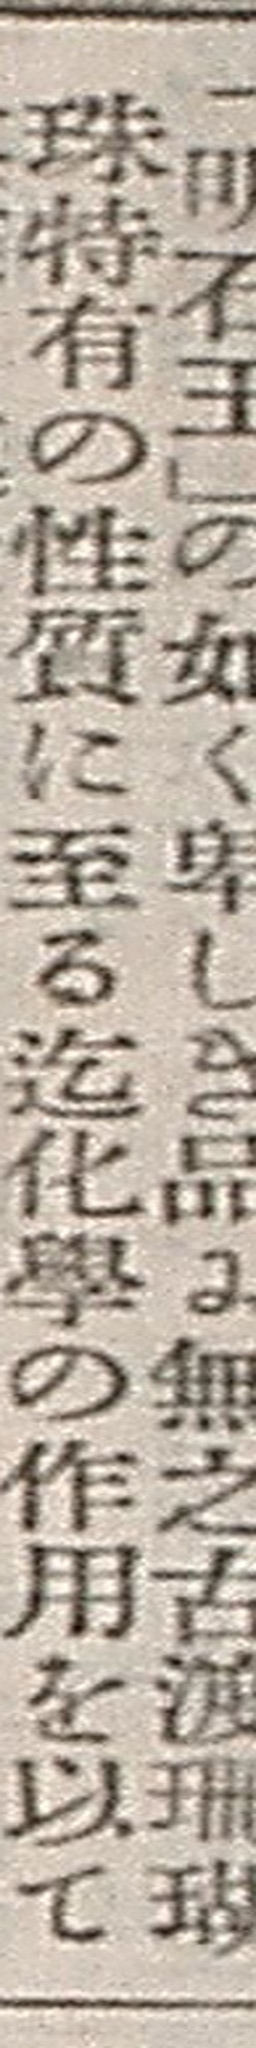珠特有の性質に至る迄化学の作用を以て
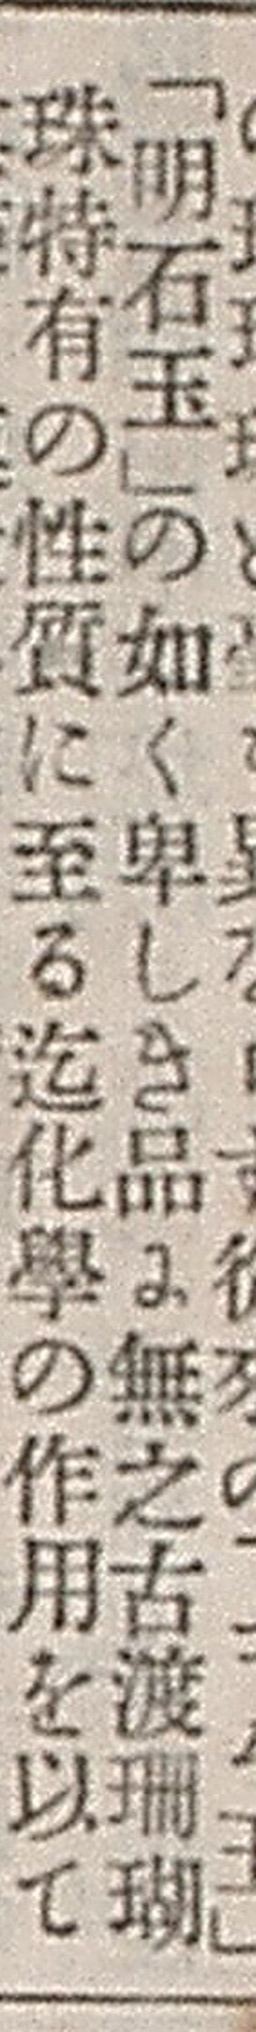珠特有の性質に至る迄化学の作用を以て
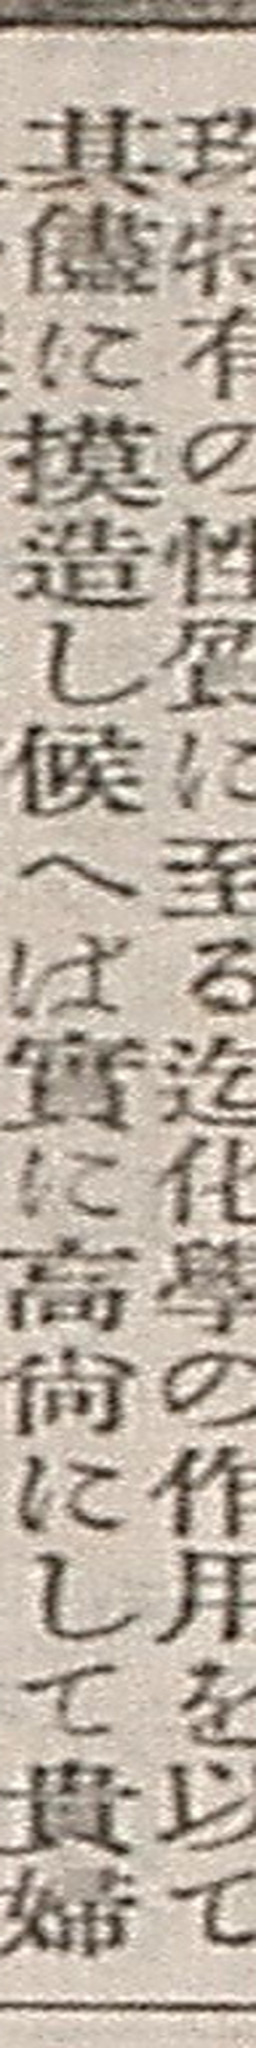其儘に模造し候へば実に高尚にして貴婦
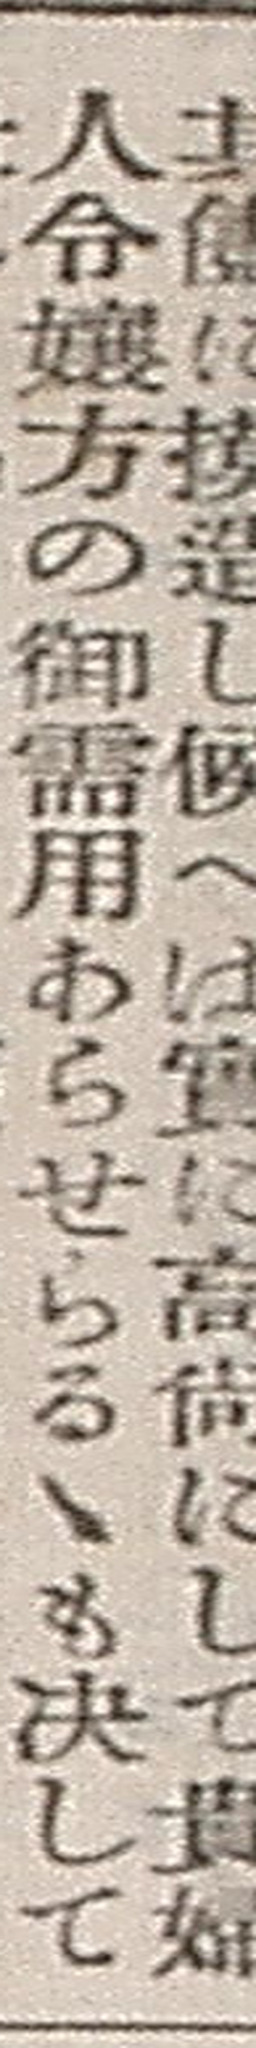人令嬢方の御需用あらせらるゝも决して
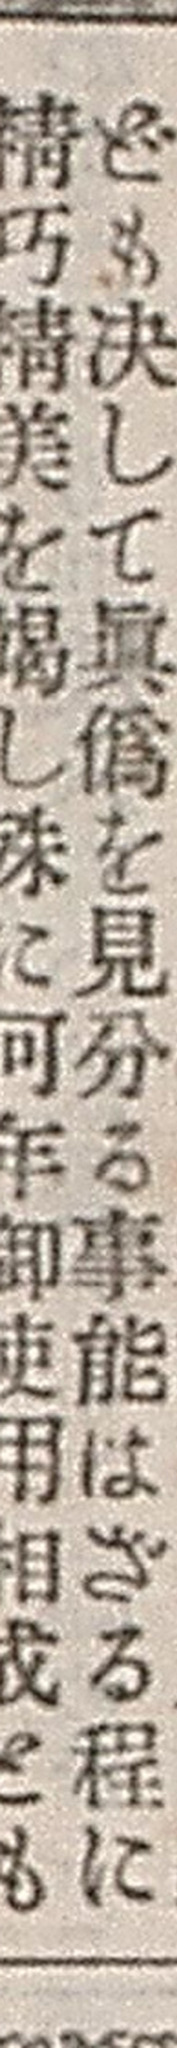ども决して真偽を見分る事能はざる程に
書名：風俗畫報臨時増刊第百二十八號　洪水被害録（下）
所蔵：東京大学地震研究所図書室 Earthquake Research Institute Library, The University of Tokyo, JAPAN
